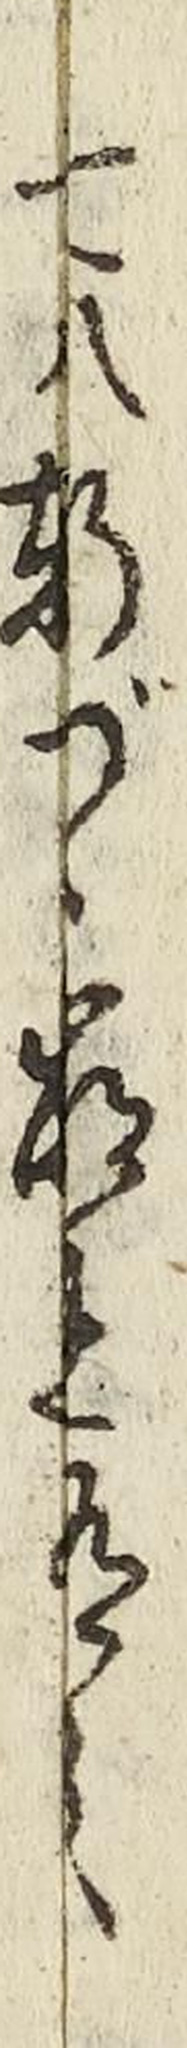七八軒づゝ崩れ有之
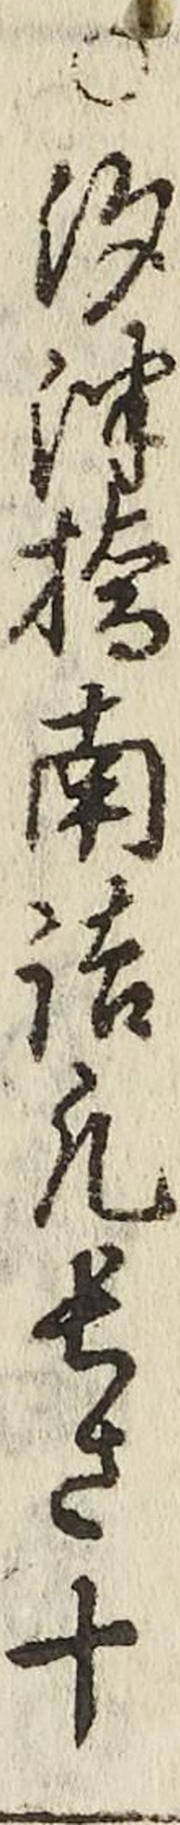〇汐津橋南詰凡長さ十
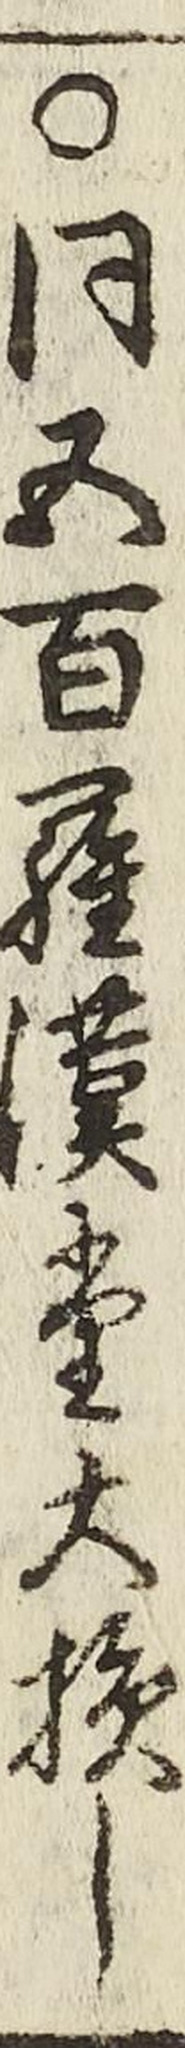〇同五百羅漢堂大損し
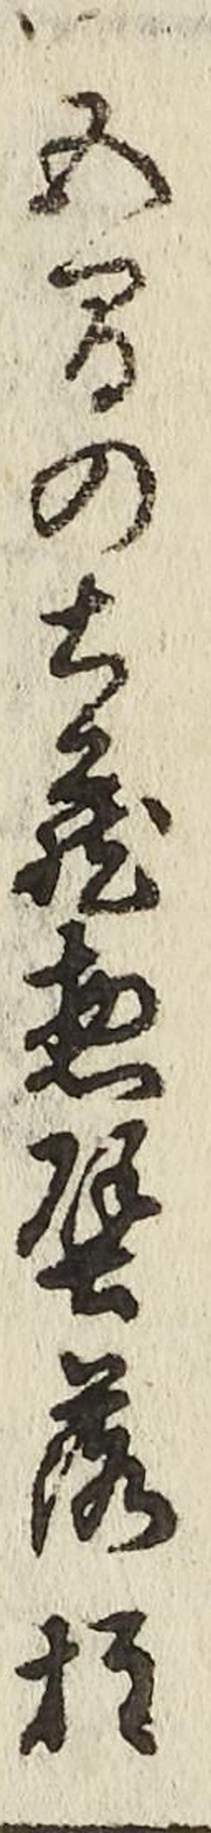五間の土蔵惣壁落柱
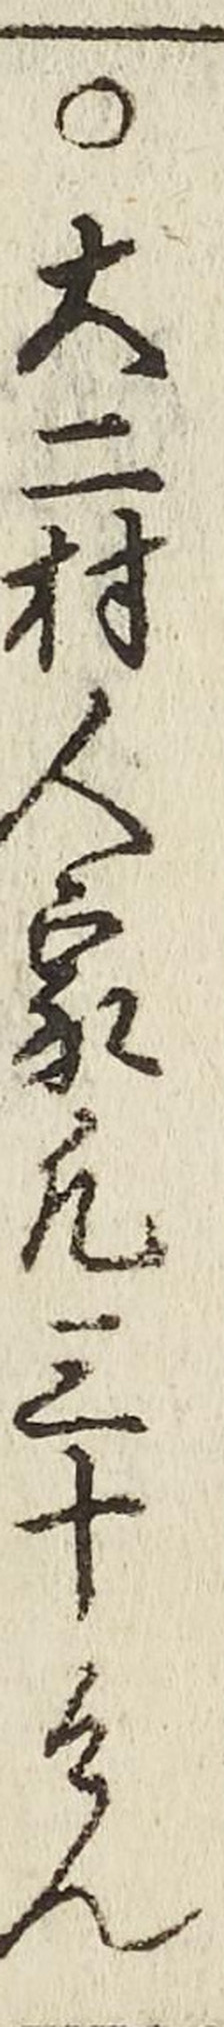〇大二村人家凡三十けん
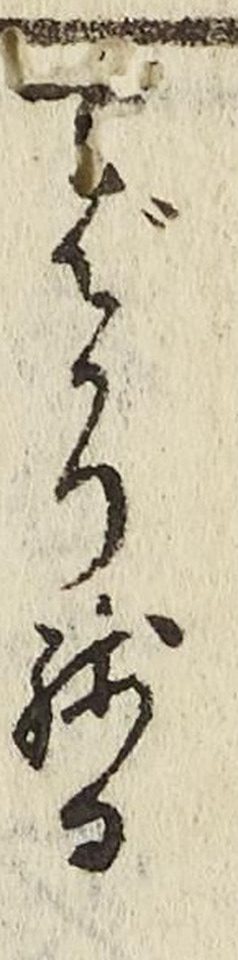ばかり残る
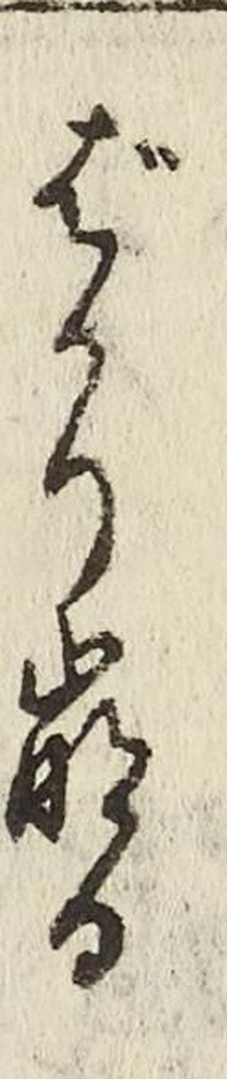ばかり崩る
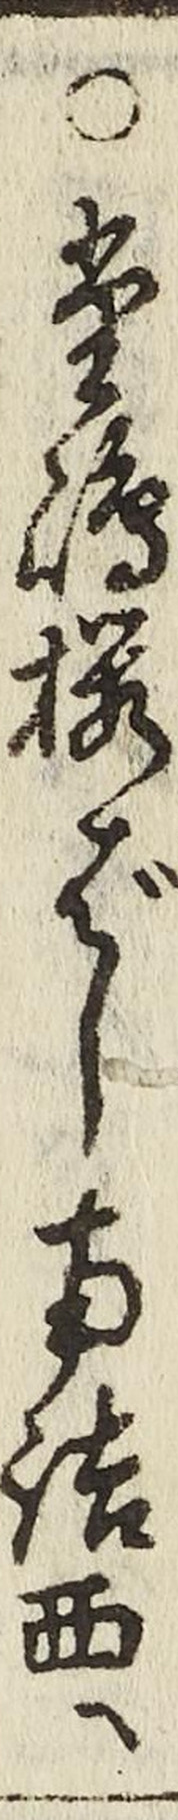〇堂嶋桜ばし南詰西へ
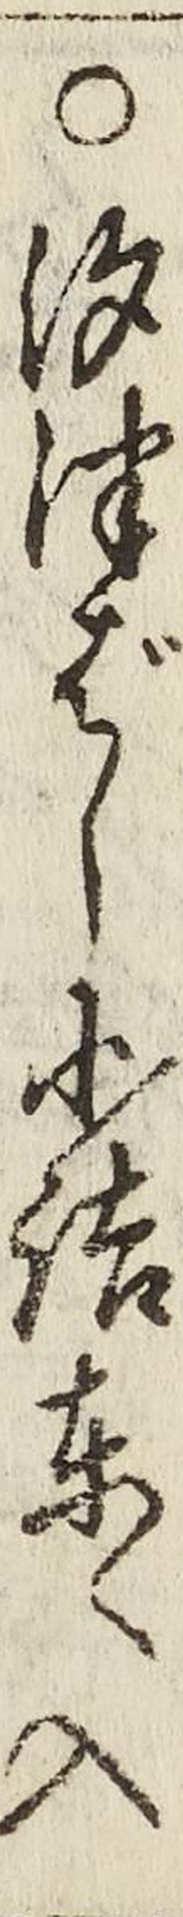〇汐津ばし北詰東へ入
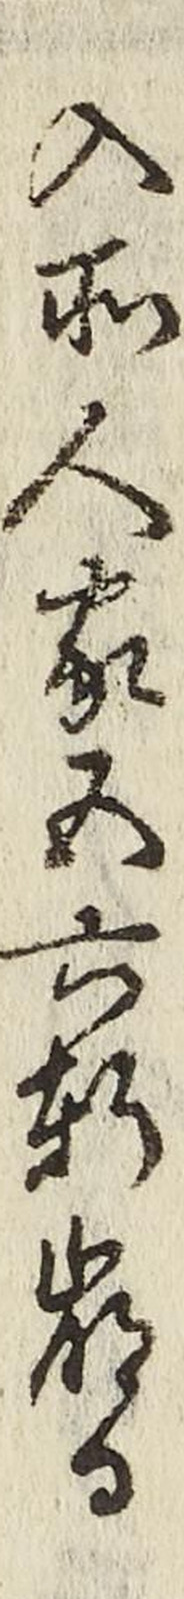入所人家五六軒崩る
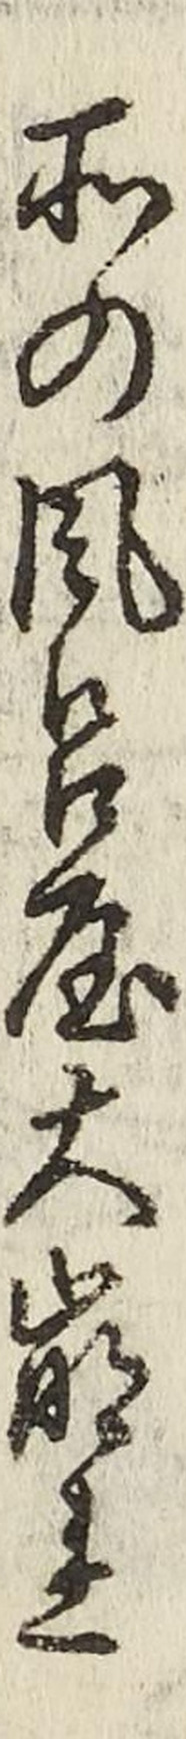所の風呂屋大崩れ
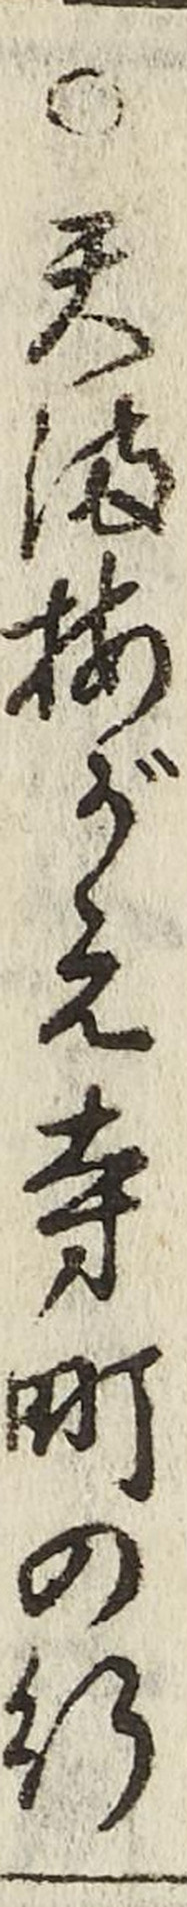〇天満梅がえ寺町の行
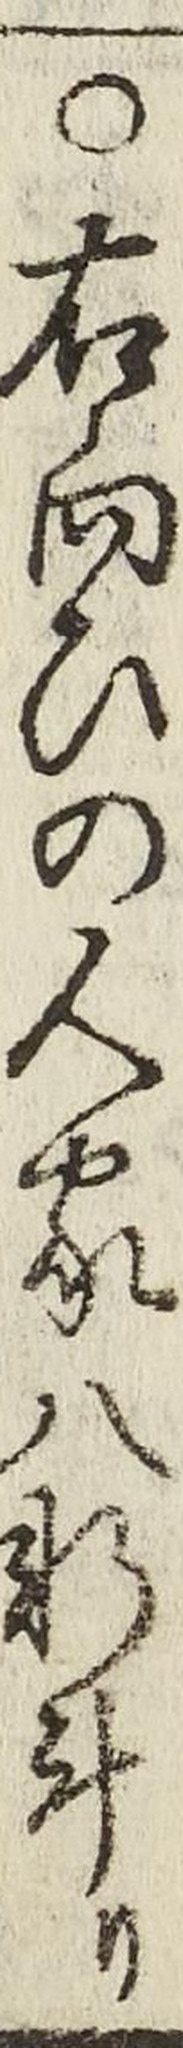〇右向ひの人家八軒計り
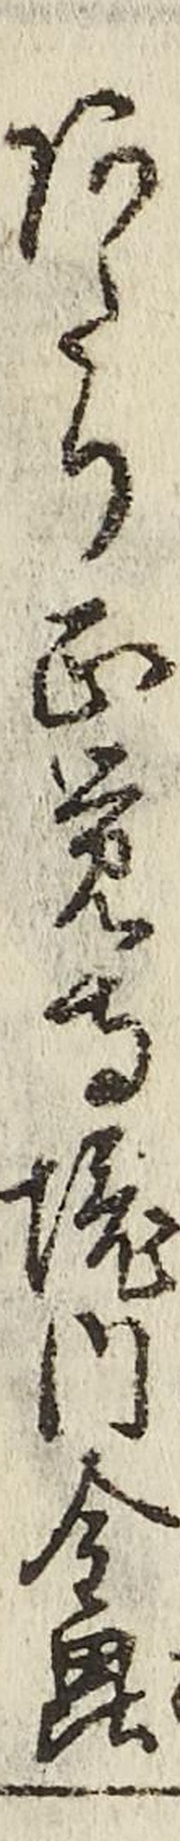あたり正覚寺境内金毘
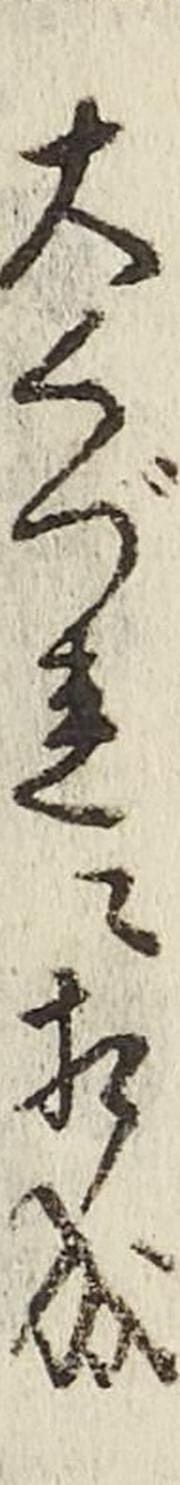大くづれニ相成
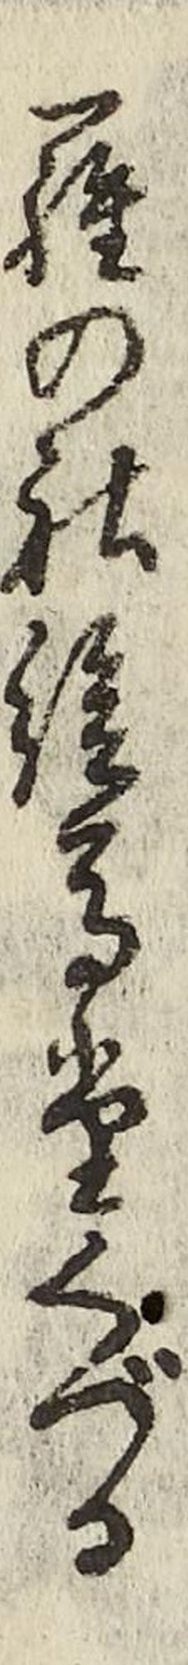羅の社絵馬堂くづる
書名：地震津浪末代噺の種　全
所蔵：東京大学地震研究所図書室 Earthquake Research Institute Library, The University of Tokyo, JAPAN
